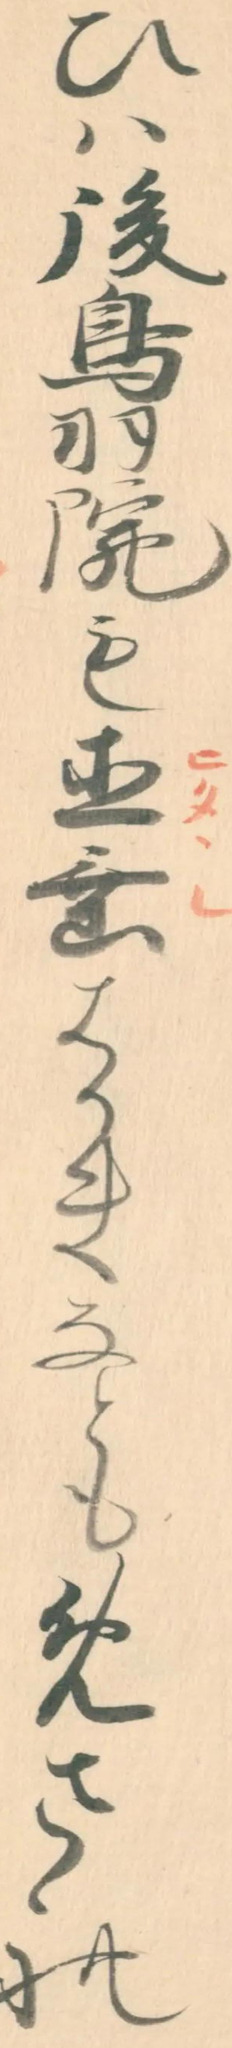ひは後鳥羽院も直垂はりまなともめさゝれ

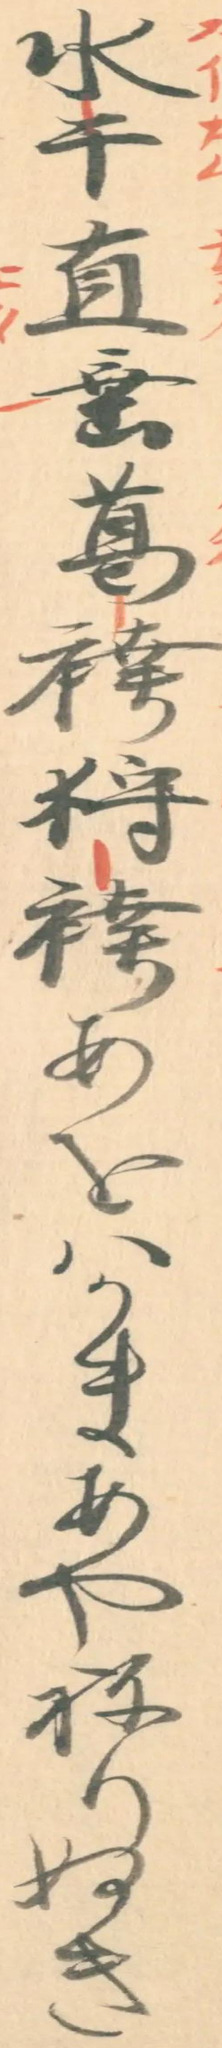水干直垂葛袴狩袴あをはかまあやねりぬき
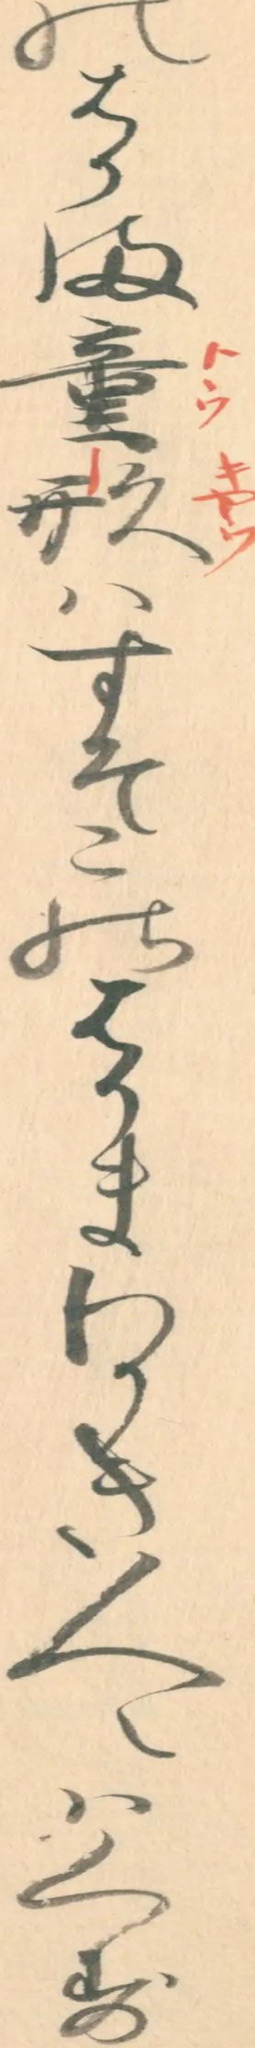のはうま童形はすそこにはかまわりき人々はくすの
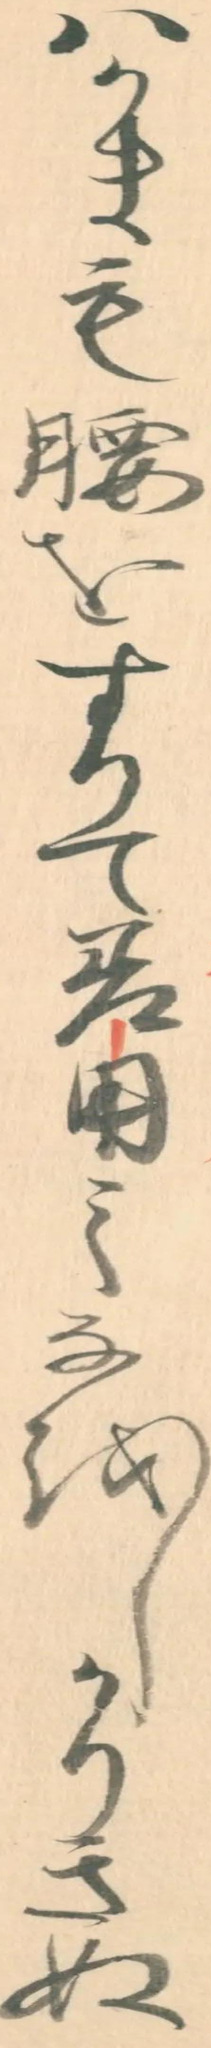はかまも腰をすりて着用みなをしかりきぬ
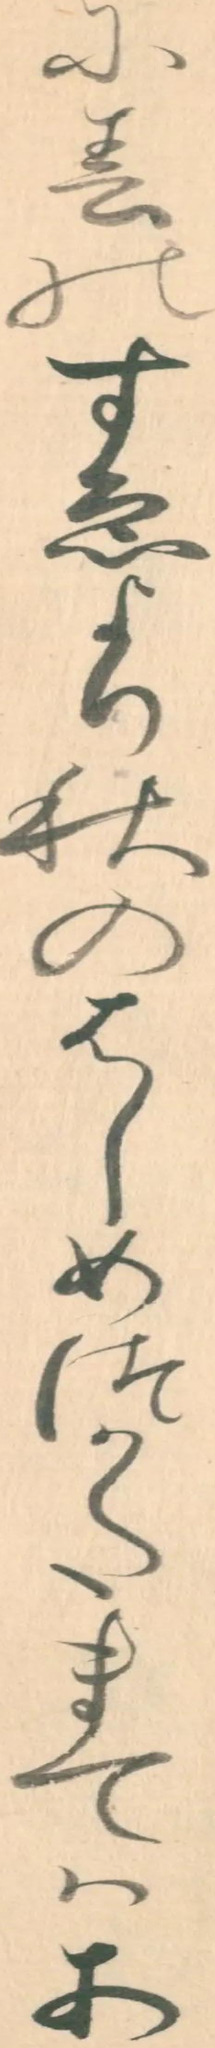に春のすゑより秋のはしめつかたまてはあ
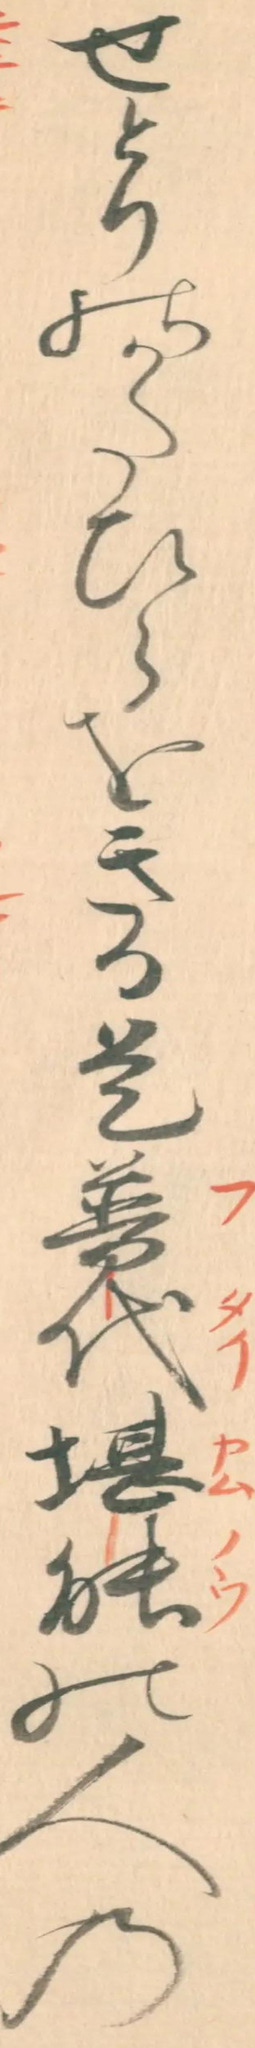せとりのかたひらをきる是普代堪能の人の
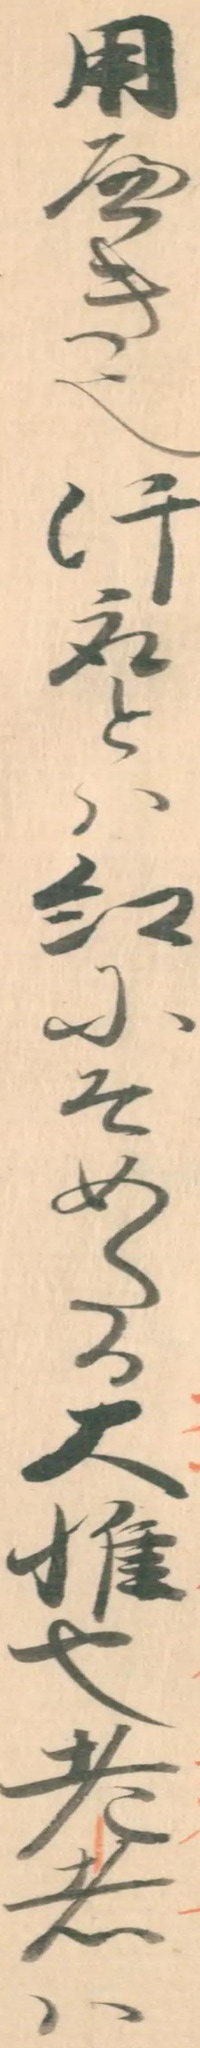用へき也汗取とは紅にそめたる大帷や老得者は
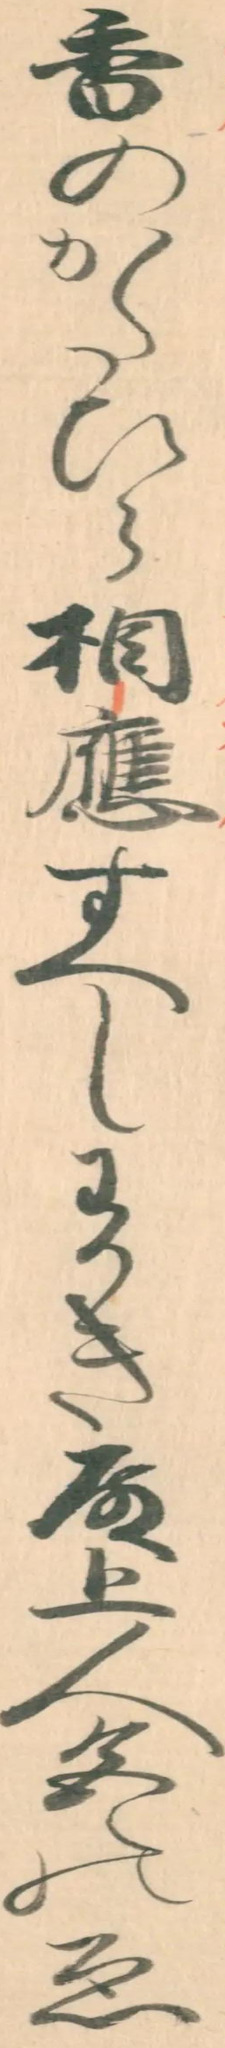香のかたひら相應すへしわかき殿上人色のゑ
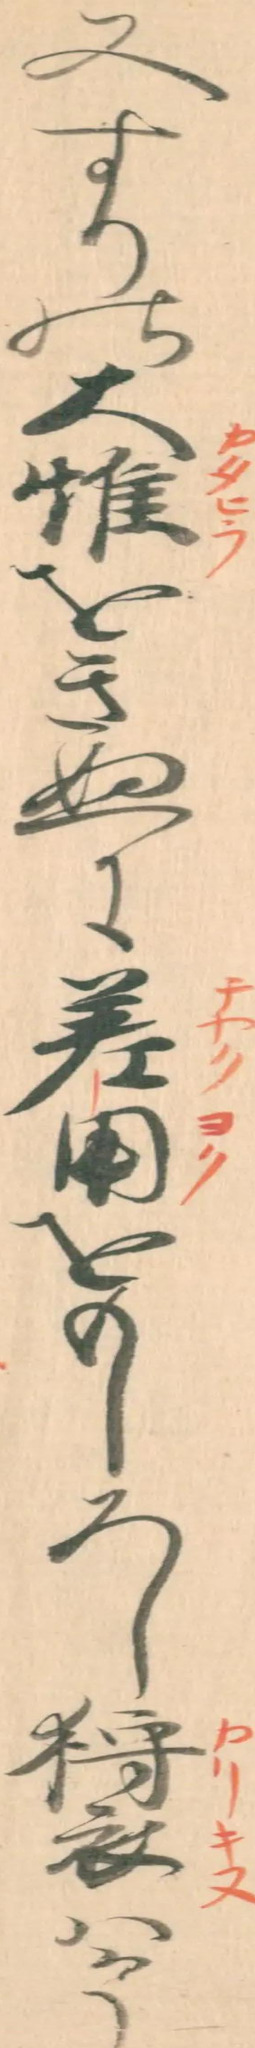又すりの大帷をきぬに着用をもしろし狩衣はかり
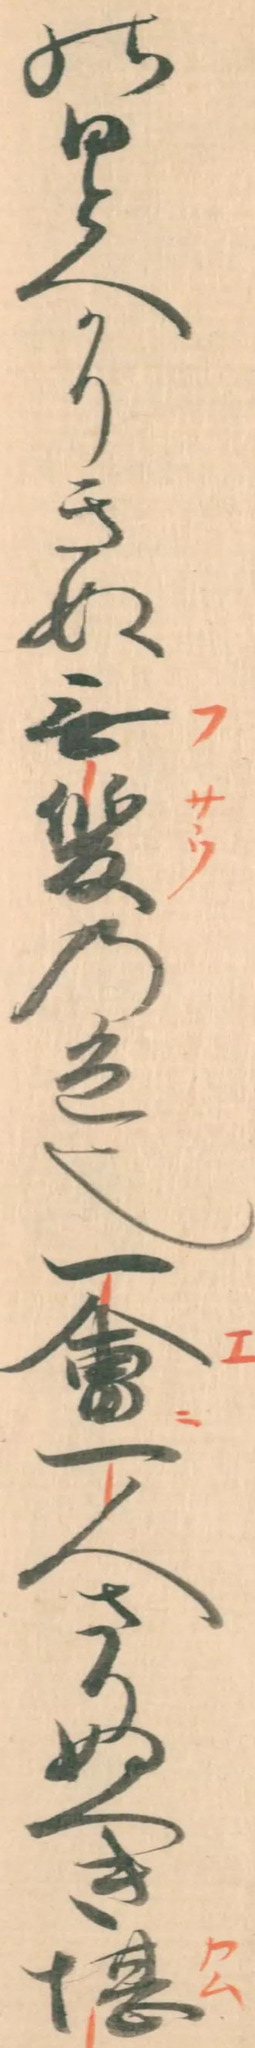のひとへかりきぬ無双の色也一會一人さりぬへき堪
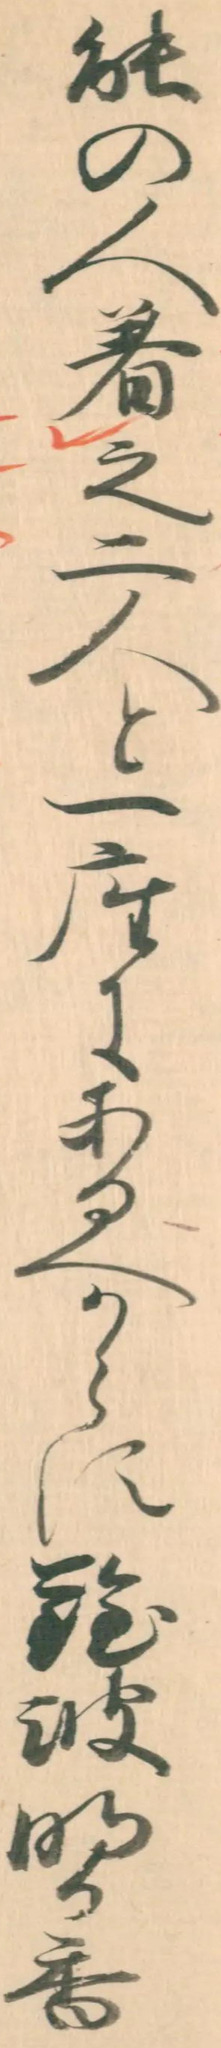能の人着之二人と一座にあるへからす難波
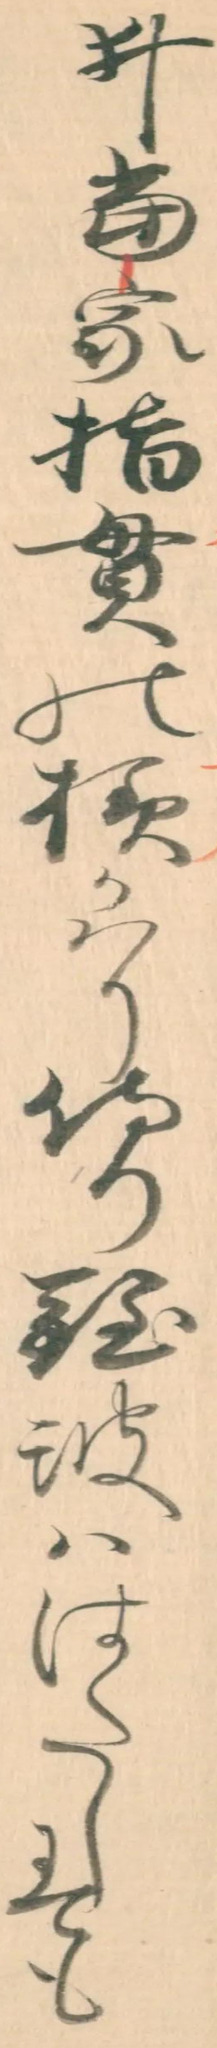當家指貫の様かはり侍り難波ははたしにても
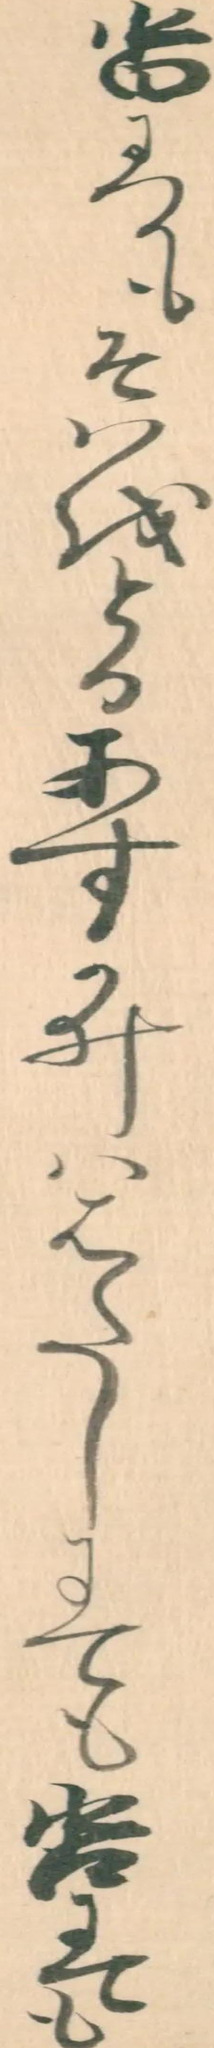沓にてもそはをとるあすかゐははたしにても沓にても
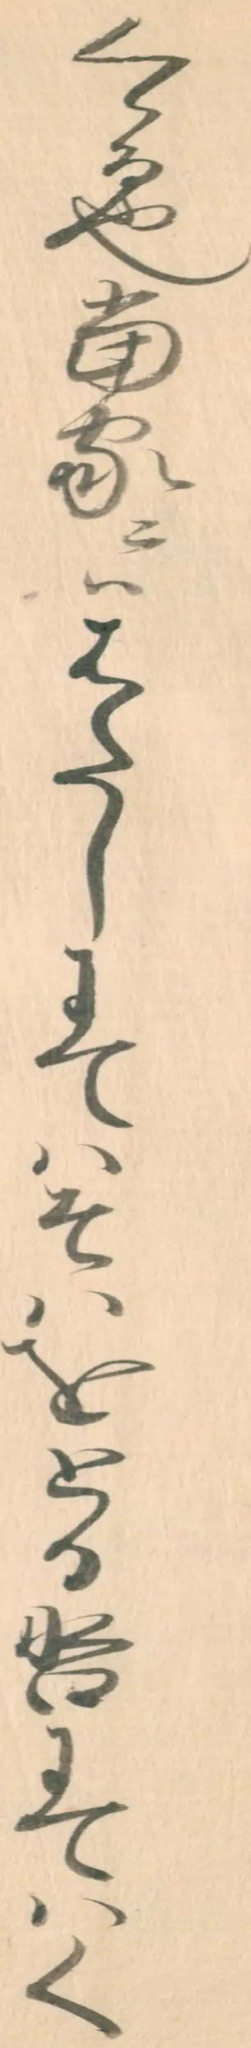くる也當家にははたしにてそはをとる沓にてはく
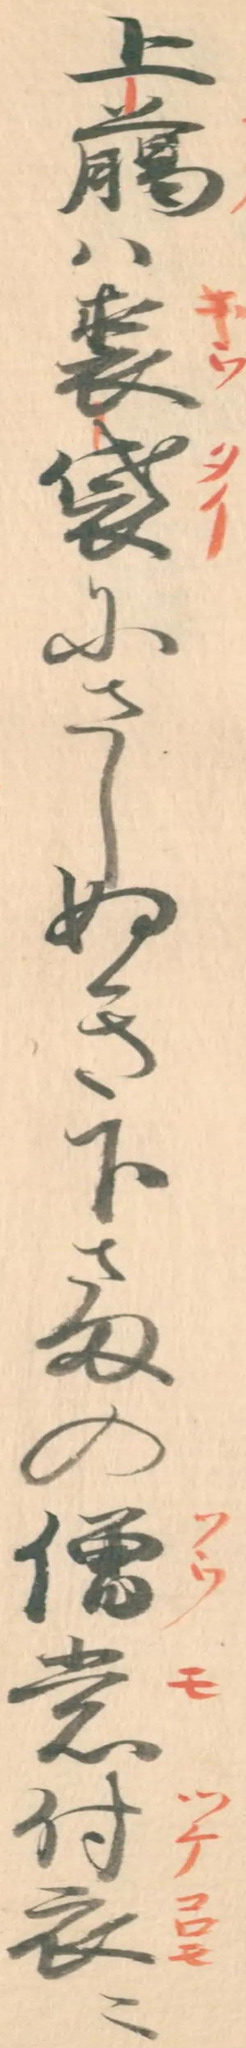上臈は裘袋にさしぬき下さまの僧裳付衣に
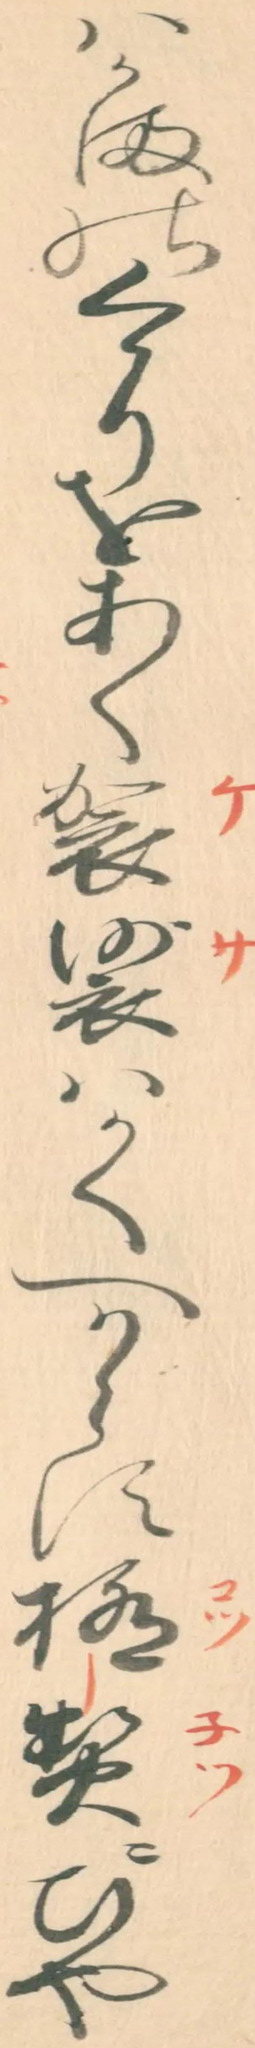はかまのくゝりをあく袈裟はかくへからす極契にひや
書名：遊庭秘抄 2巻. [1]
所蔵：国立国会図書館 National Diet Library, JAPAN
